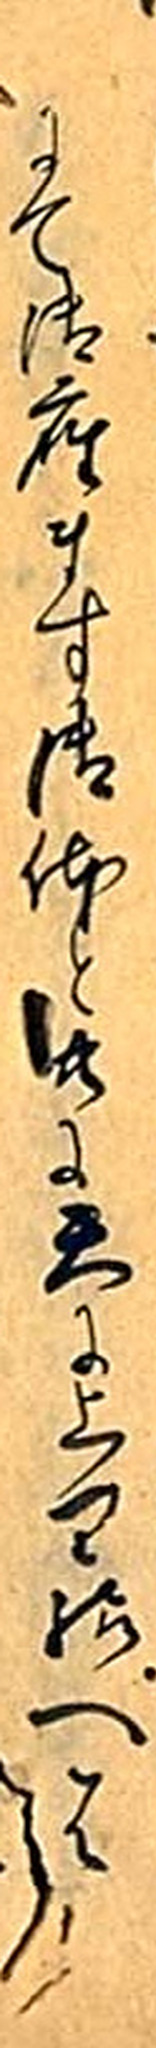にて御座ます御体と共に天に上り給へは
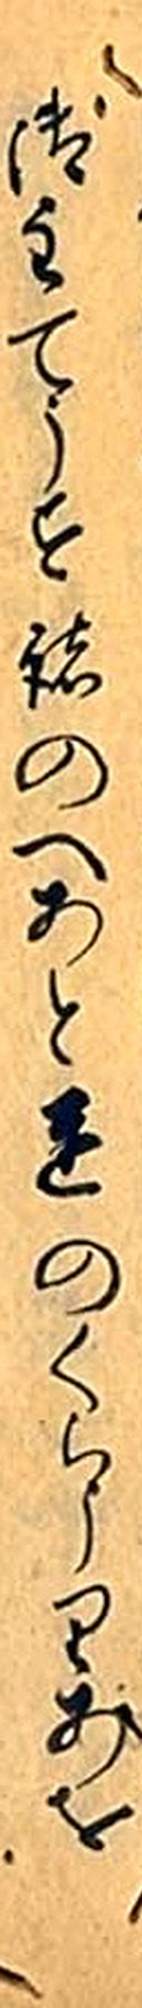御主てうす諸のへあと達のくらうりあを
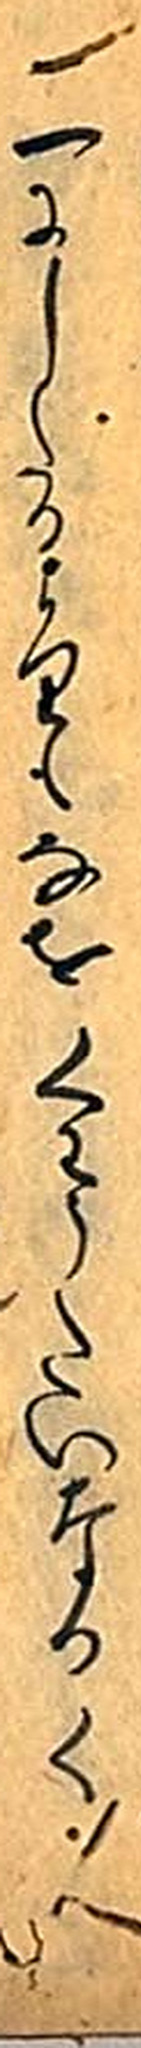一にしたるよりもなをくわうたいなるく
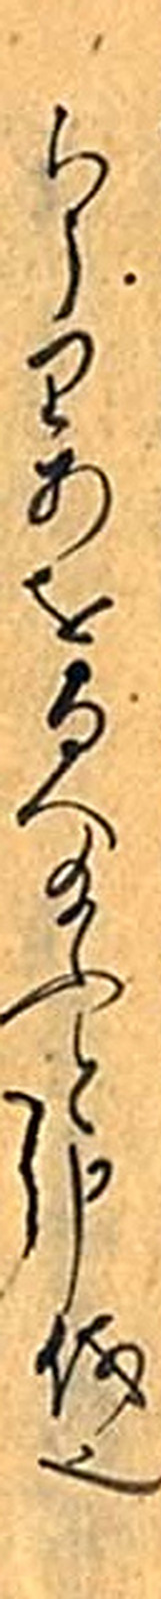らうりあを与へ給ふと申儀也
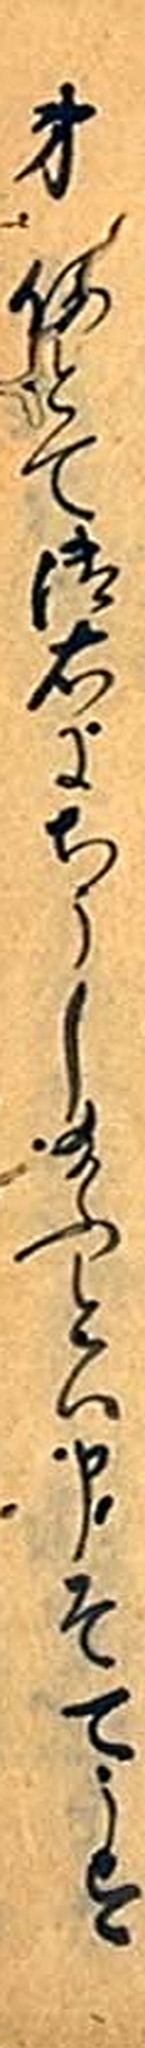弟何とて御右にちうし給ふとは申そてうす
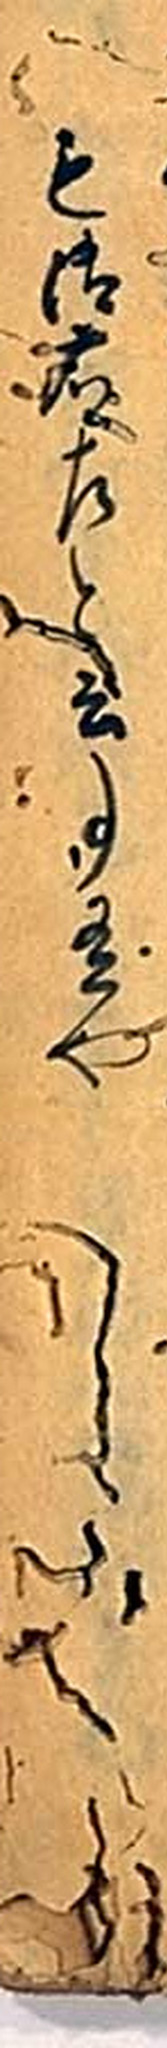も御右左と云事有や
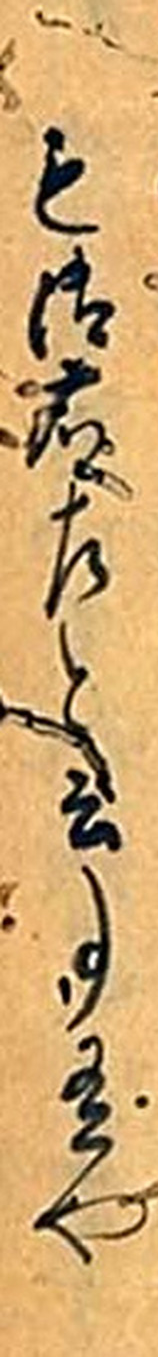も御右左と云事有や

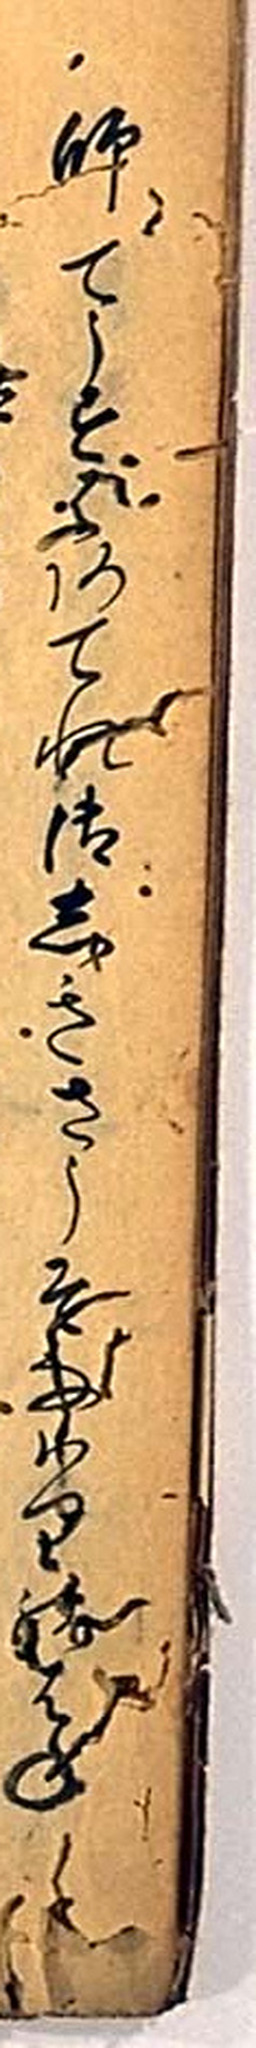師てうすはあてれ御しきさうそなはり給はね
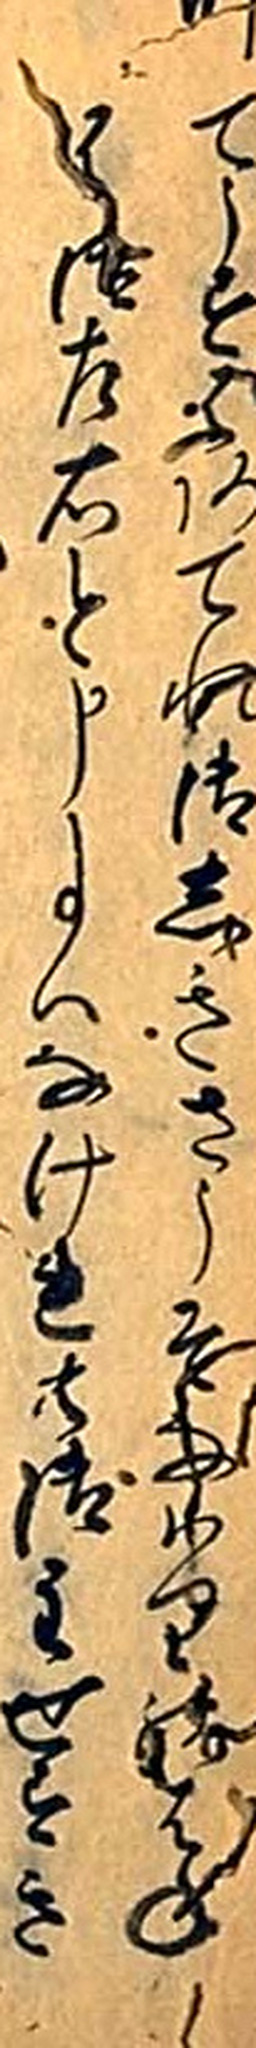は御左右と申事はなけれ共御主せすき
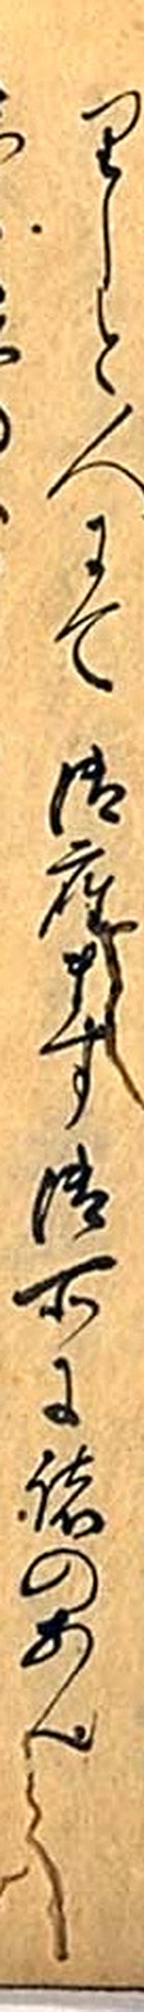りしと人にて御座ます御所に諸のあん
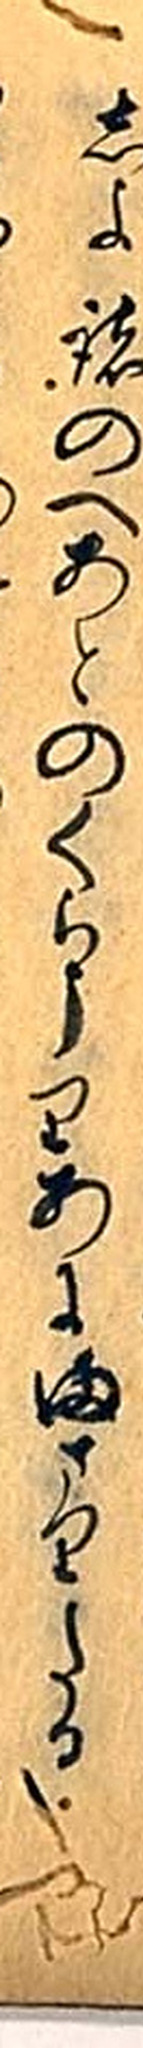しよ緒のへあとのくらうりあにまさりたる
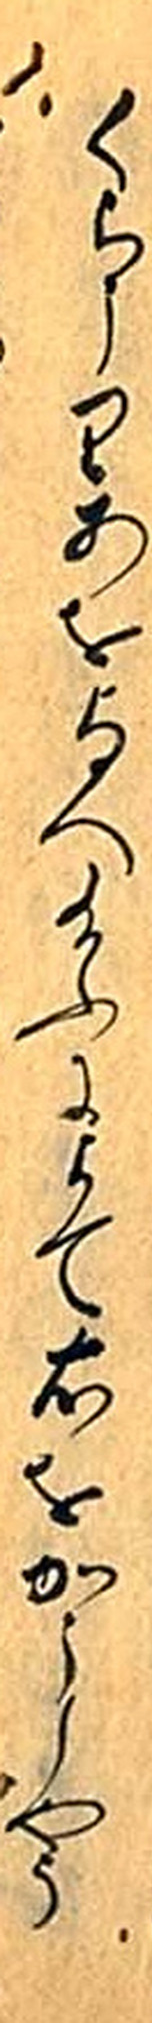くらうりあを与えへ給ふによて右をかうしやう
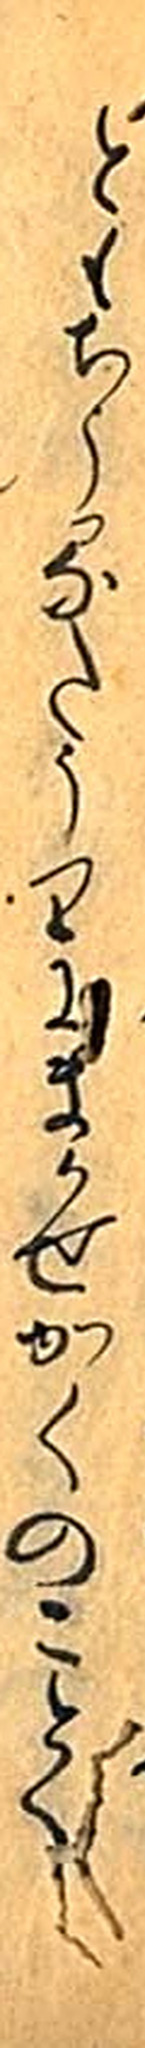ともちうるたうりにまかせかくのことく
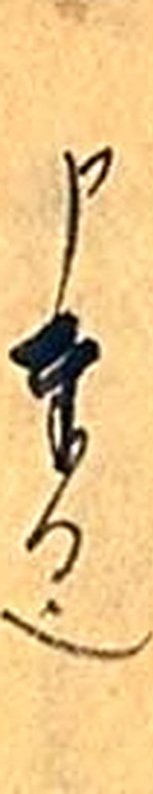申奉る也
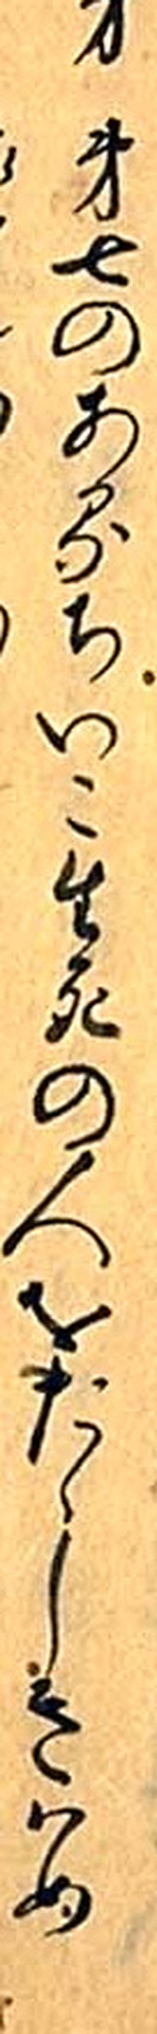弟第七のあるちいこ生死の人をたゝしきはめ
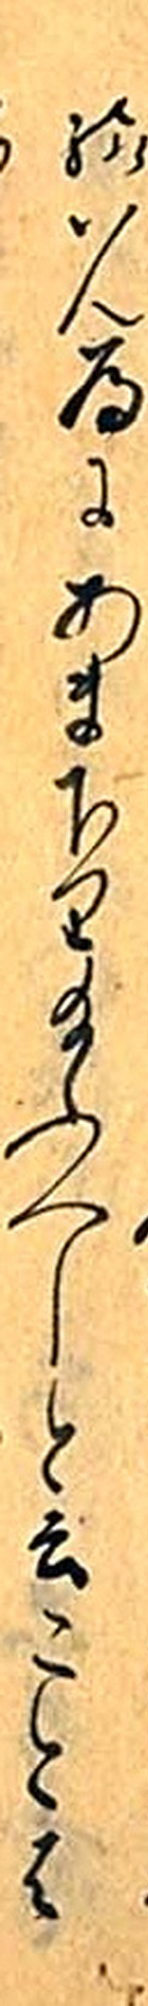給はん為にあま下り給ふへしと云ことは
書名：ドチリナ・キリシタン
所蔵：東京大学総合図書館 / General Library in the University of Tokyo
